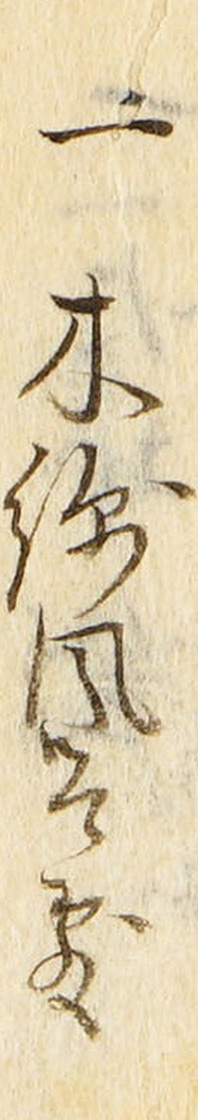一木綿風呂敷弐
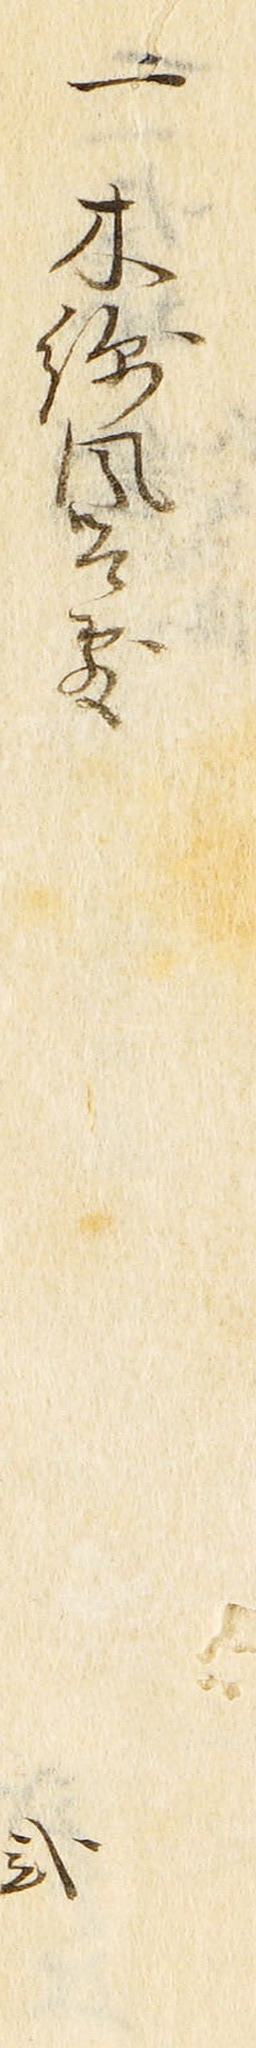一木綿風呂敷弐
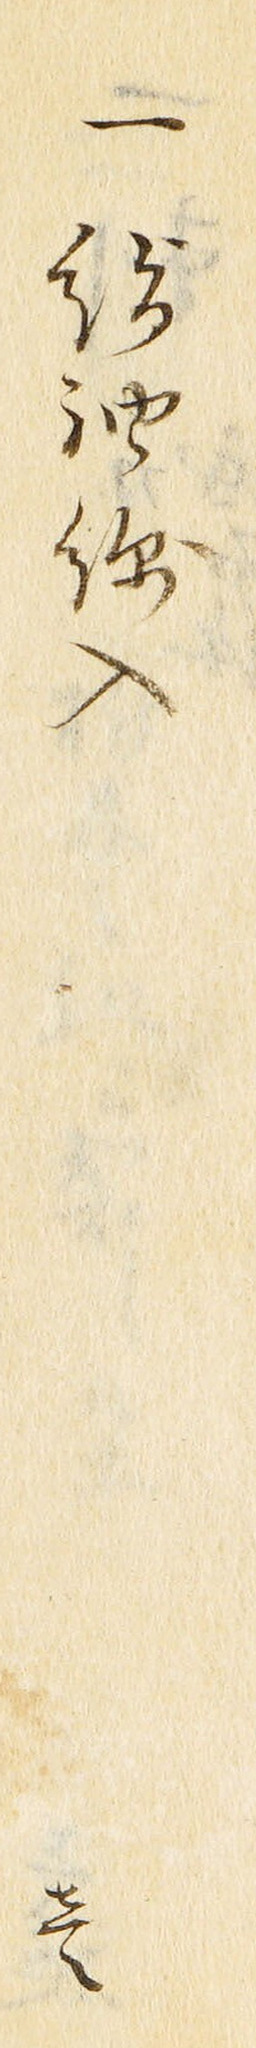一絹袖綿入壱
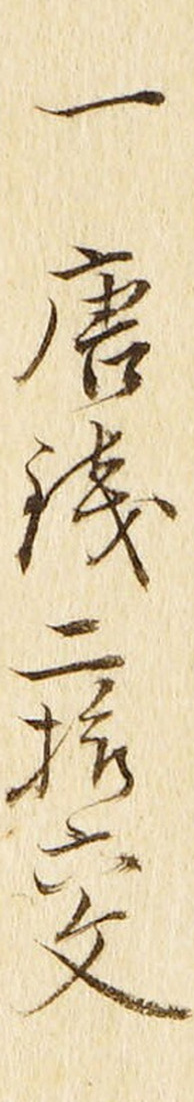一唐銭二拾六文
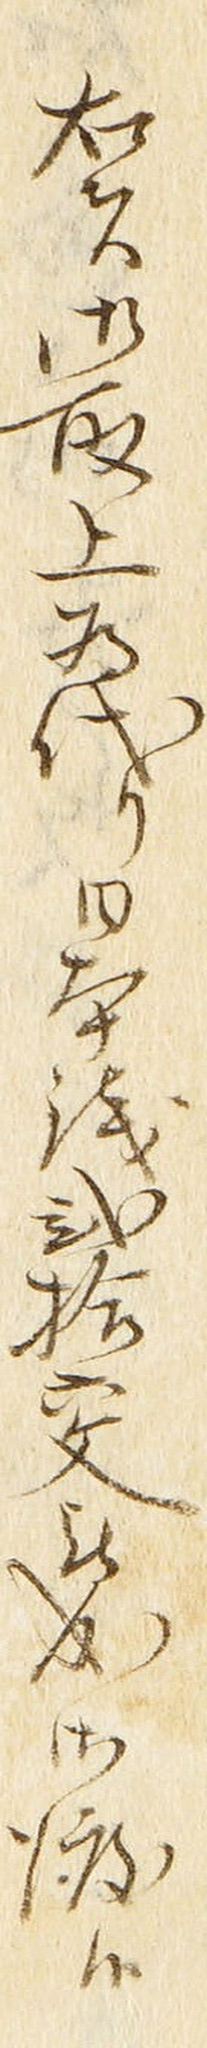右は御取上為代り日本銭弐拾八文被成御渡候
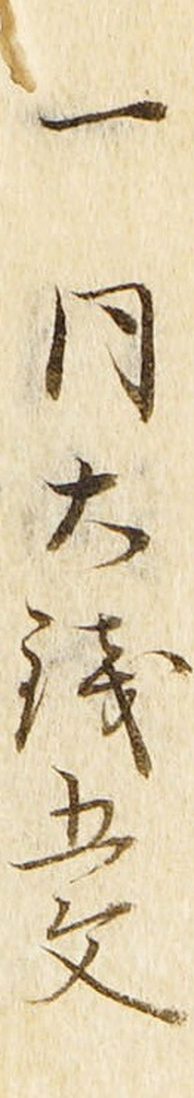一同大銭五文
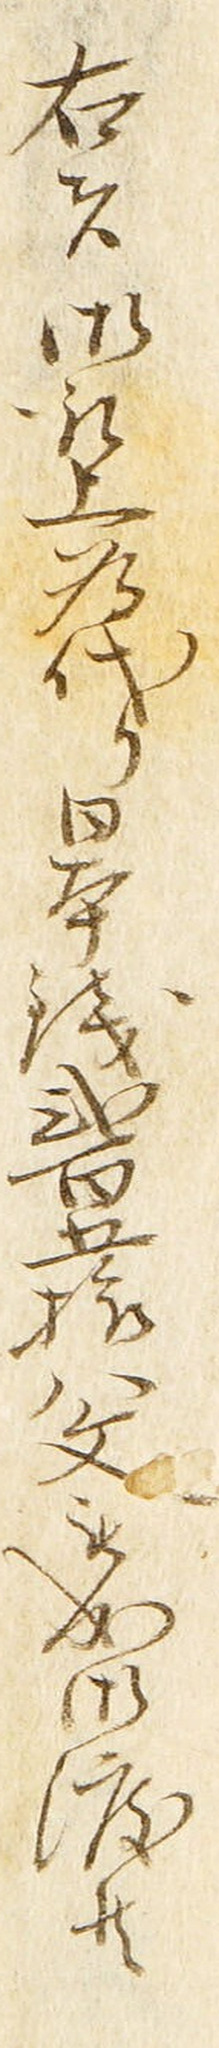右は御取上為代り日本銭弐百五拾八文被成御渡候
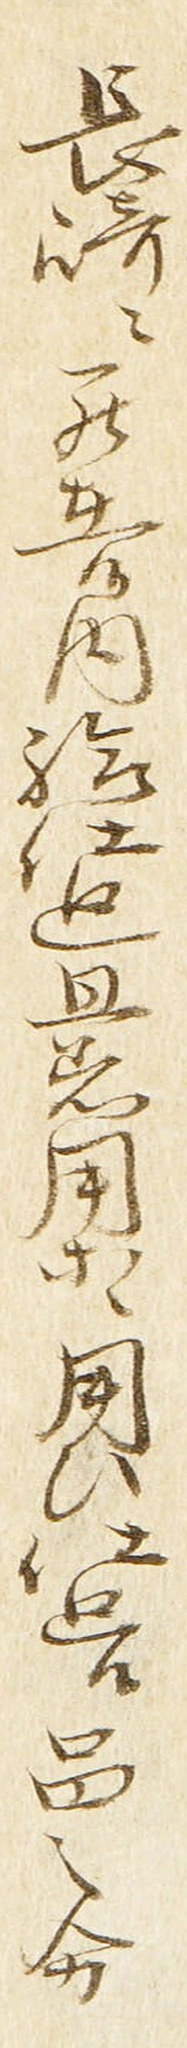長崎に罷在候内給仕廻且着用等に用ひ仕廻候品之分

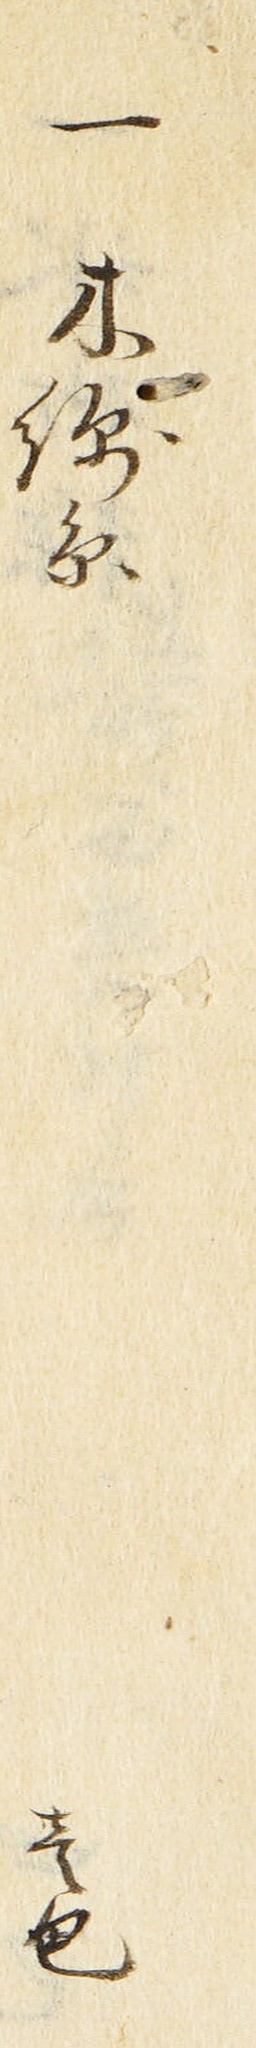一木綿糸壱包
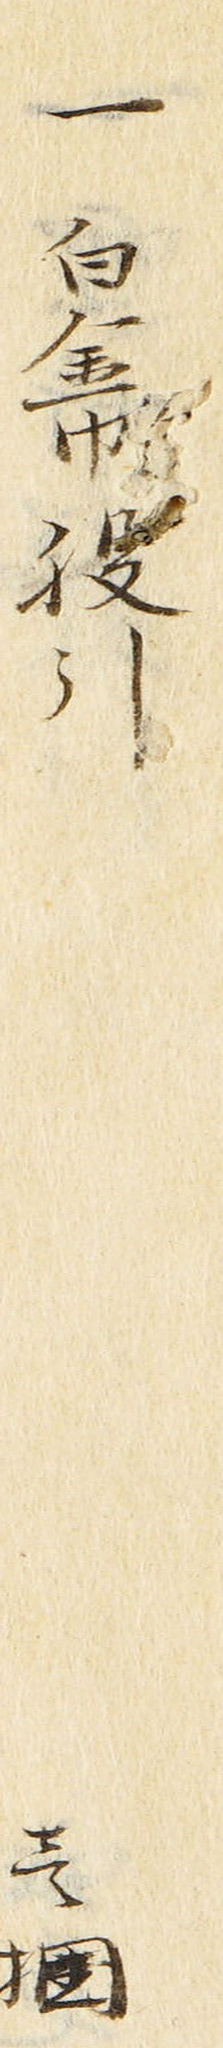一白金巾股引壱掴
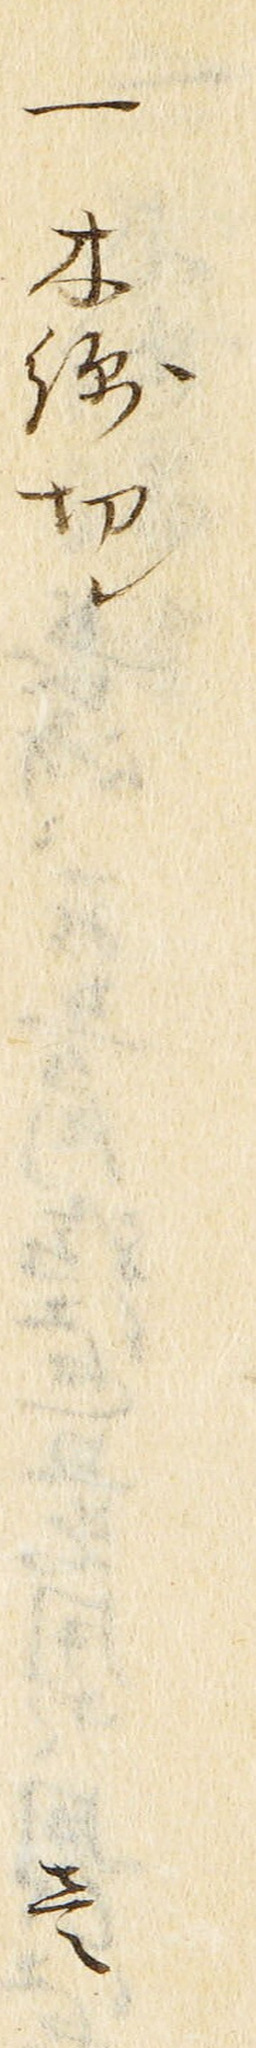一木綿切れ壱
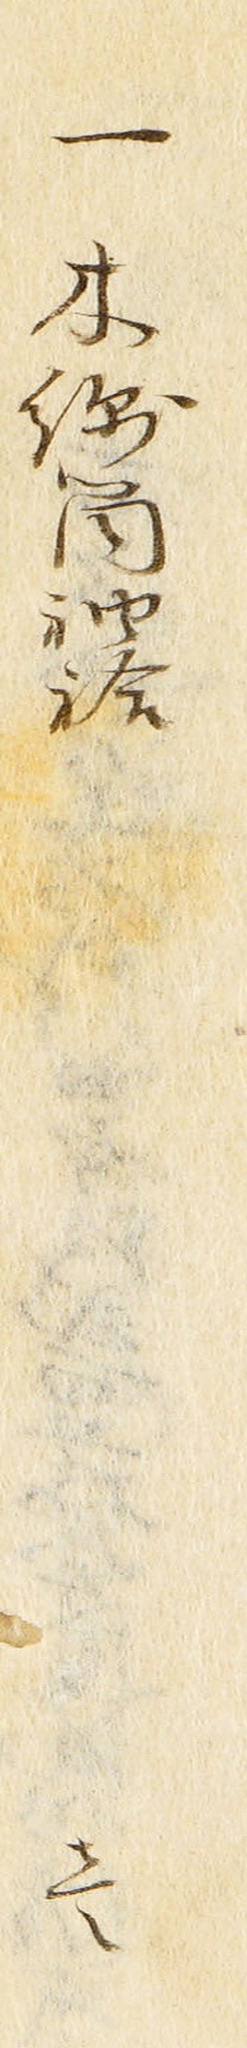一木綿筒袖袷壱
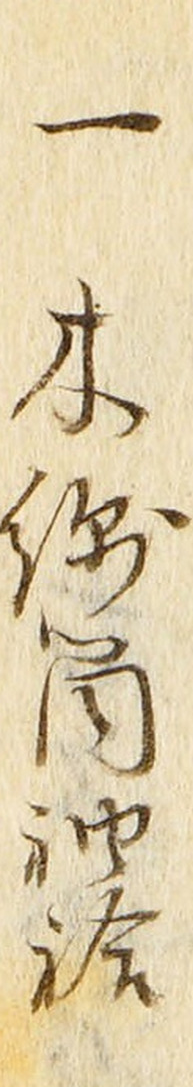一木綿筒袖袷壱
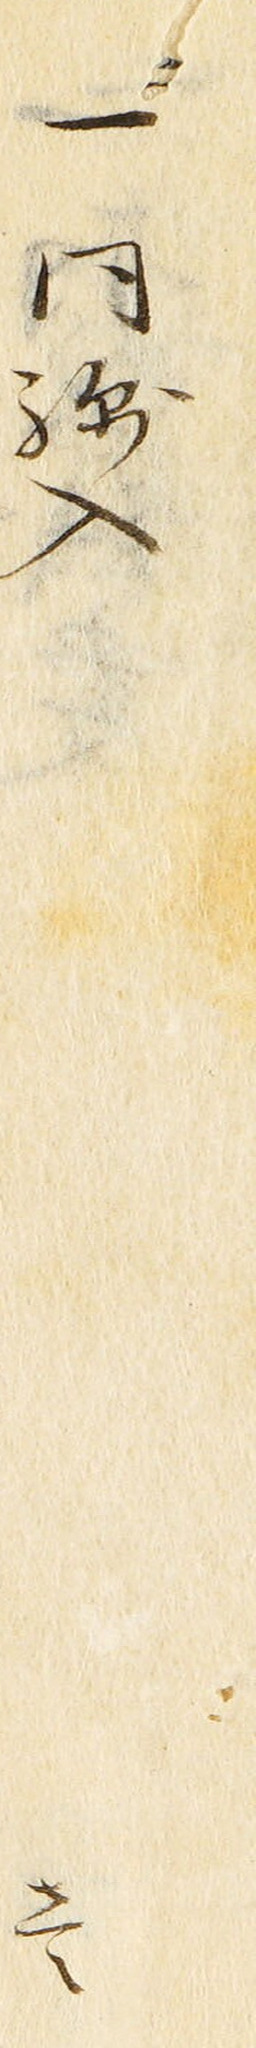一同綿入壱
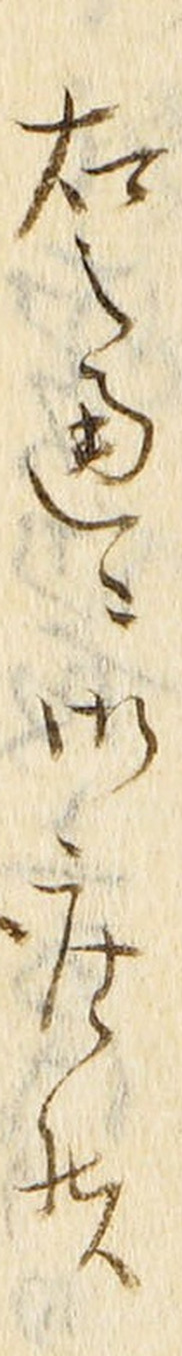右之通に御座候
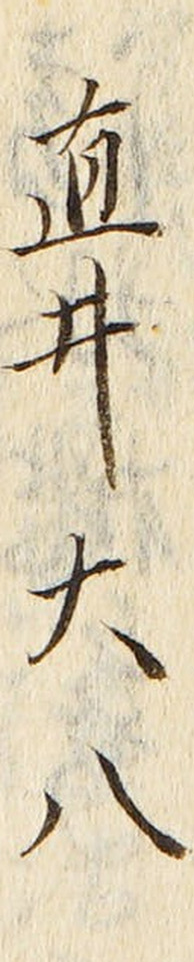直井大八
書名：長崎漂流記
